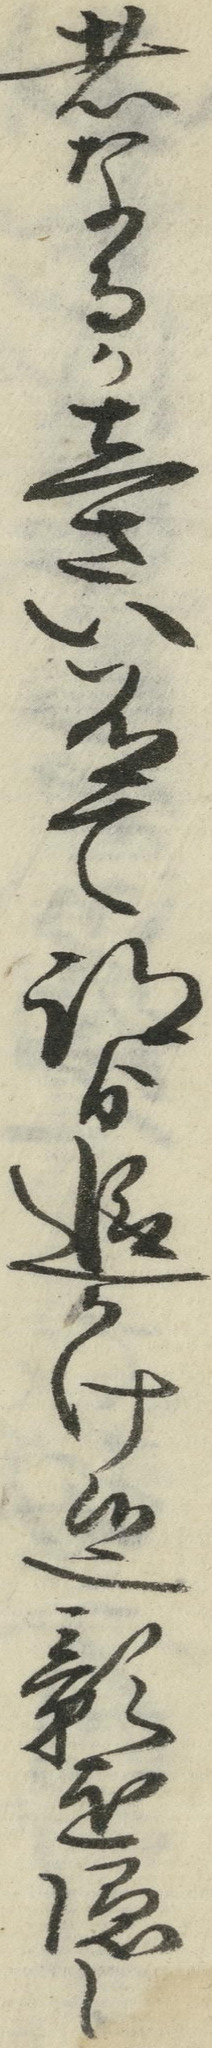者なるかしさい有て跡ゟ追かけ候也影を隠し
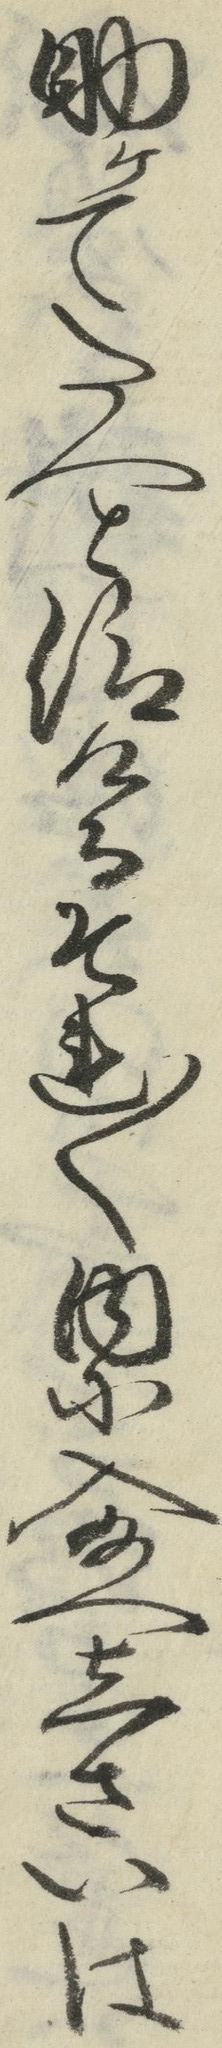助ケてたへと仰けるそれ〳〵内に入給へしさいは
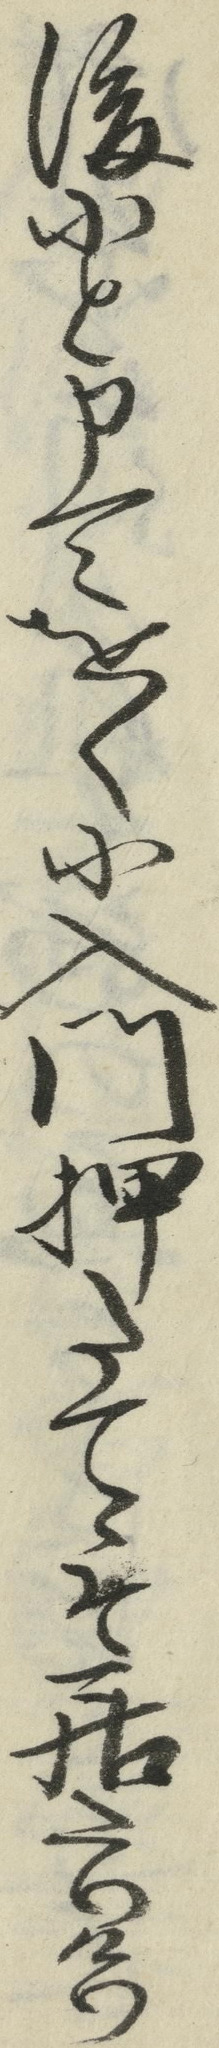後にと申てをくに入門押たてゝそ居たりけり
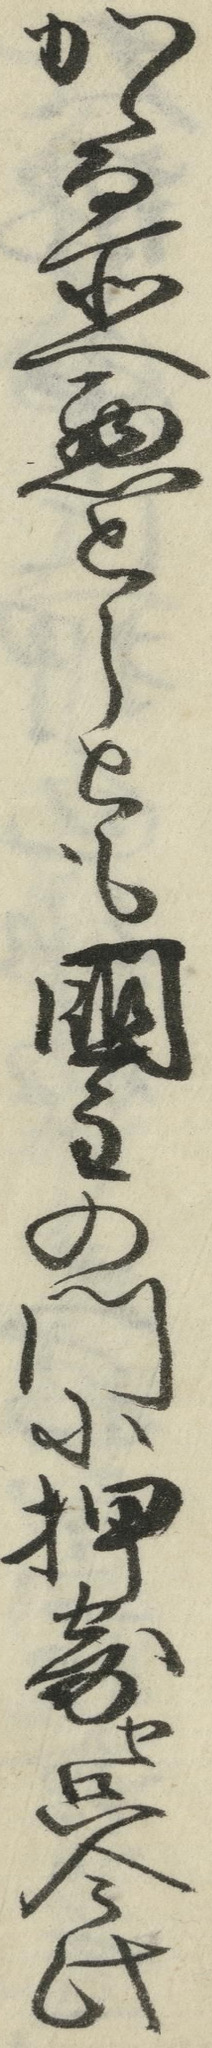かゝる所へ悪とうとも国主の門に押寄セ只今此
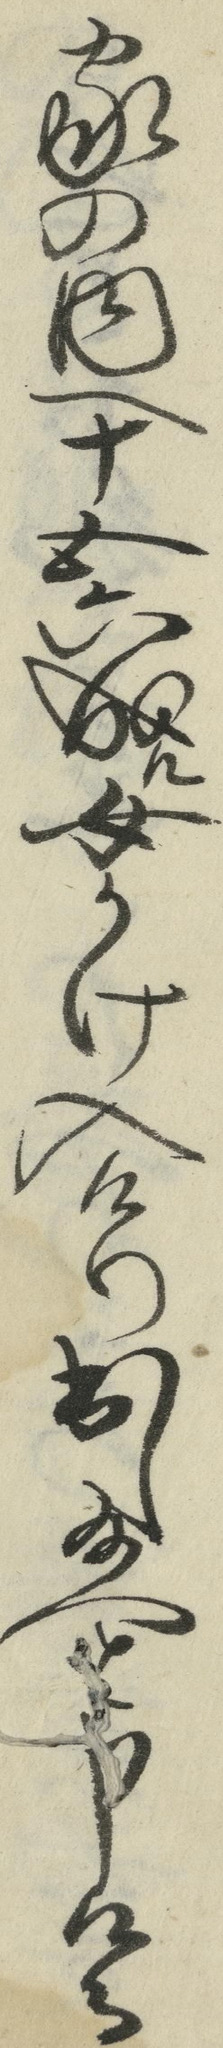家の内へ十五六成ル女かけ入けり出し給へと申ける
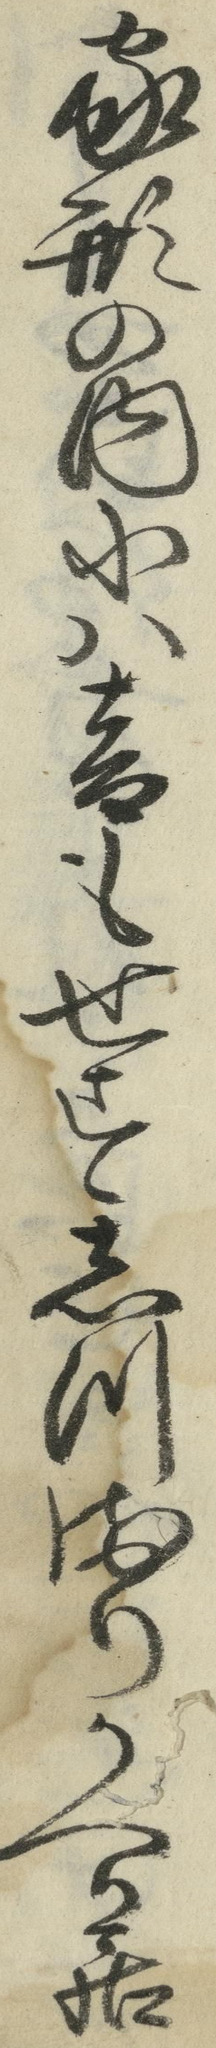家形の内にハ音もせすしつまりかへり居
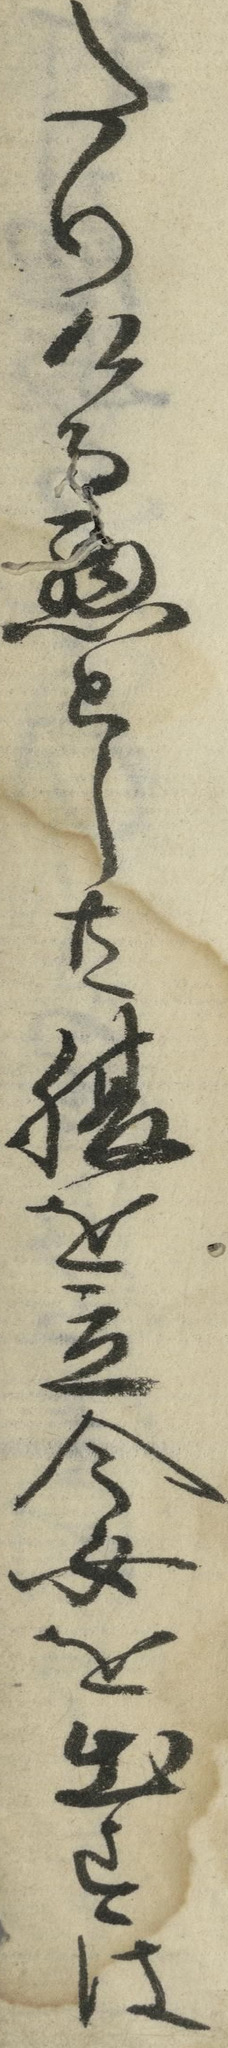たりける悪とう共腹を立今女を出すは

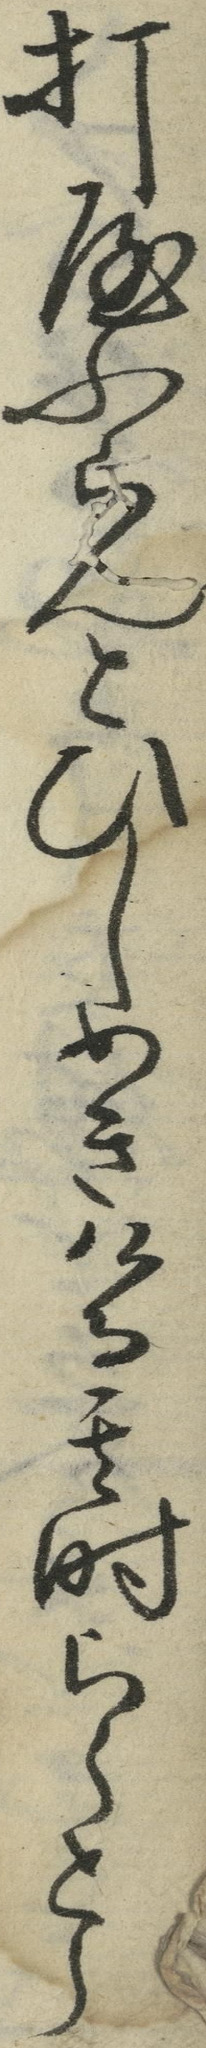打やふらんとひしめきける其時らうとう
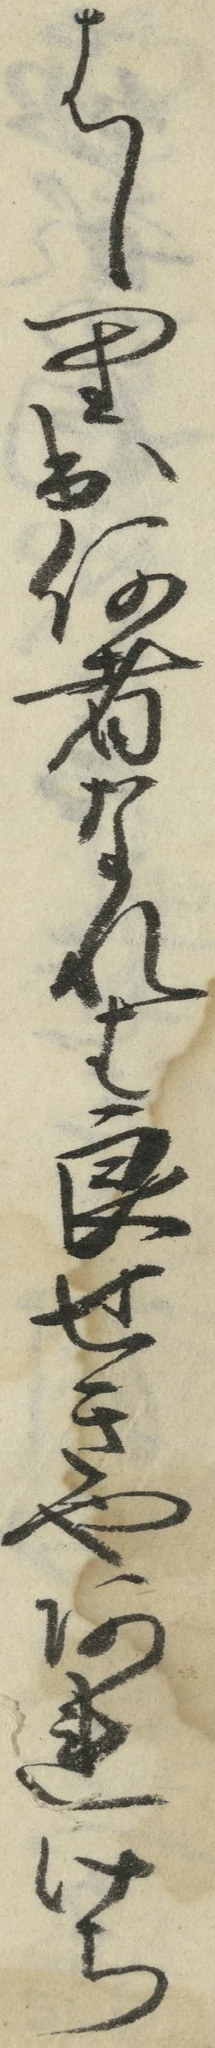はしり出何者なれは良せきやあれけち
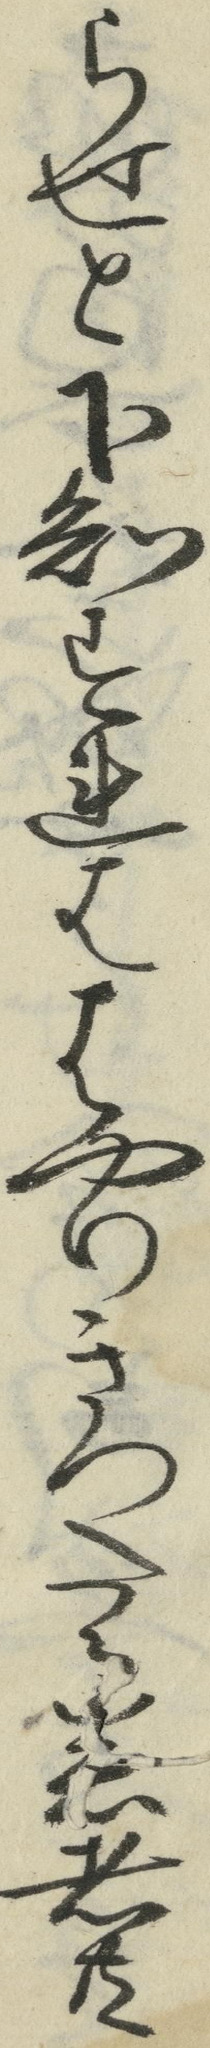らせと下知すれははやりきつたる若者共
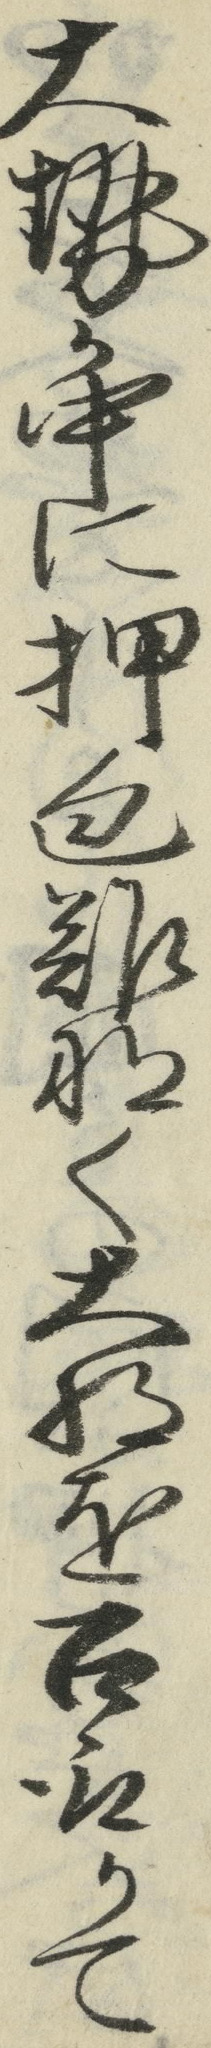大勢か中に押包難なく大将を召取りて
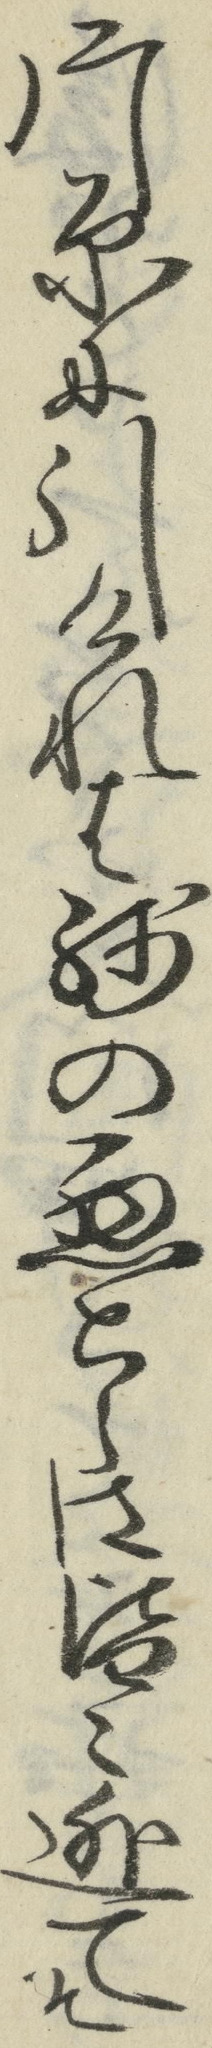片原に引けれは残の悪とうは皆〻逃てそ
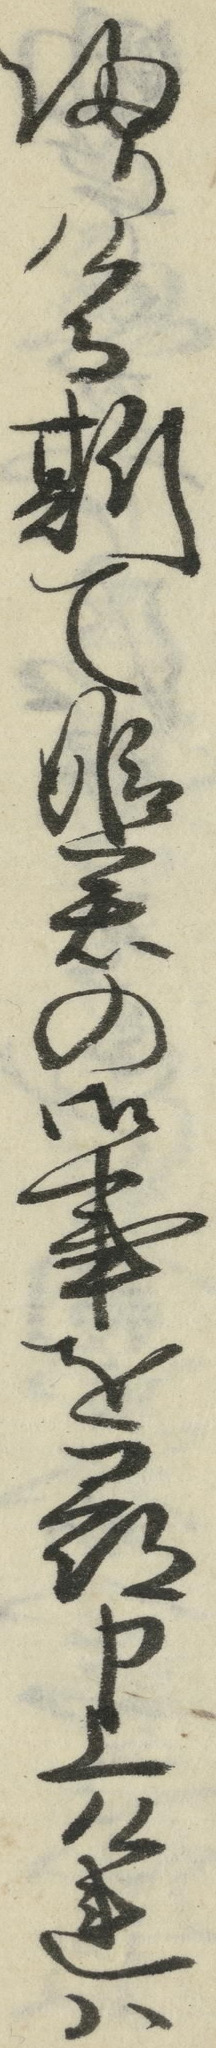帰りける斯て姫君の御事を尋申上けれは
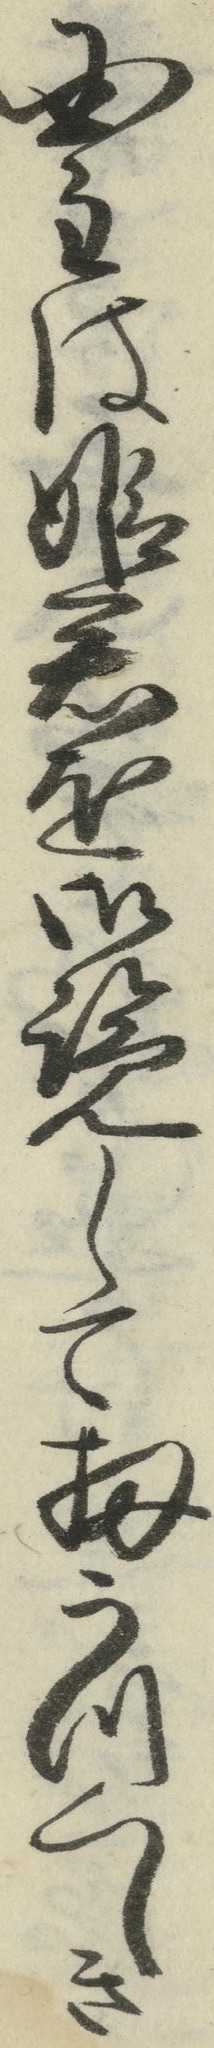国主は姫君を御覧して扨うつくしき
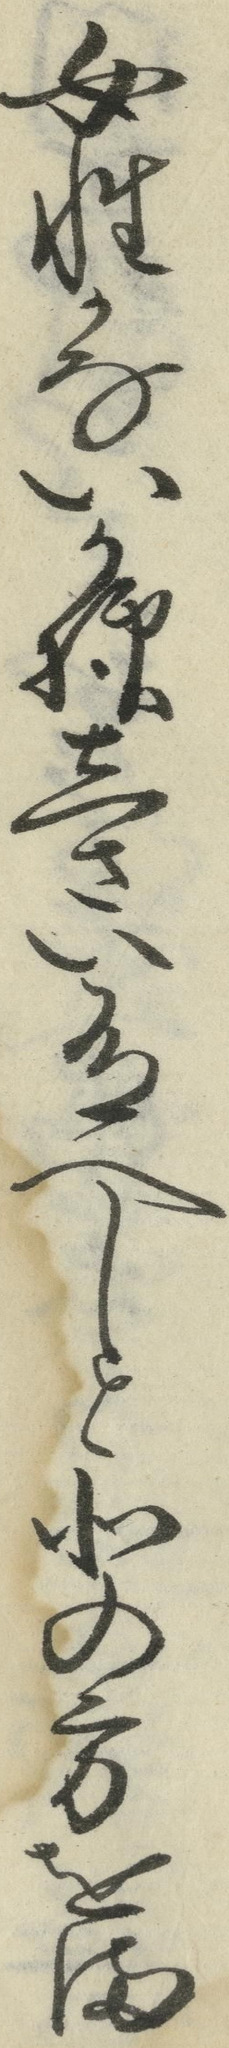女性かないか様しさい有へしと北の方をま
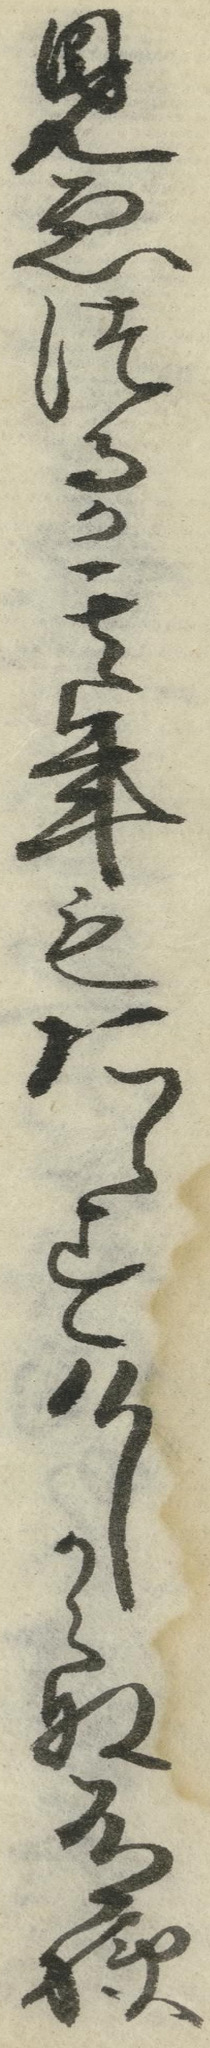見ゑつるか其年もたゝすけしからぬ有様
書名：浅間記
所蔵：東京大学地震研究所図書室 Earthquake Research Institute Library, The University of Tokyo, JAPAN
